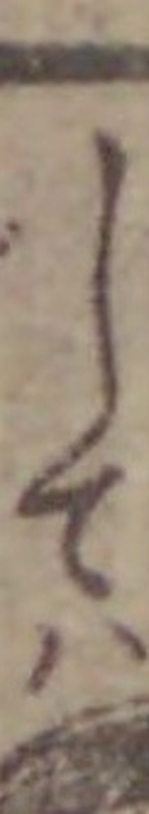しては
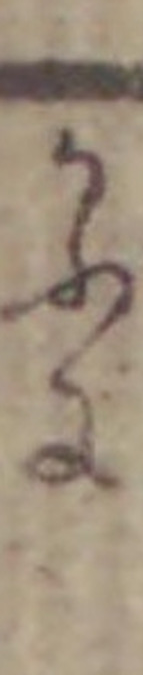かぶに
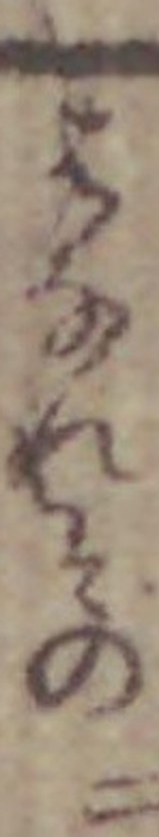はなれその
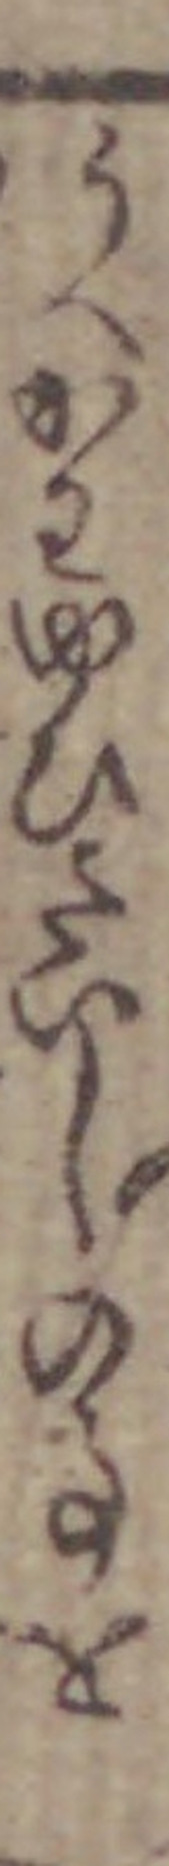うへかわゆひさいしの事を
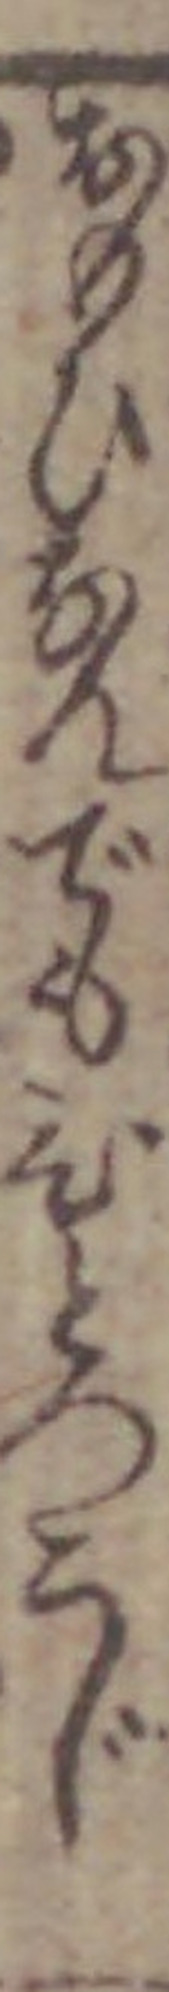おもひなんでもひとつこじ
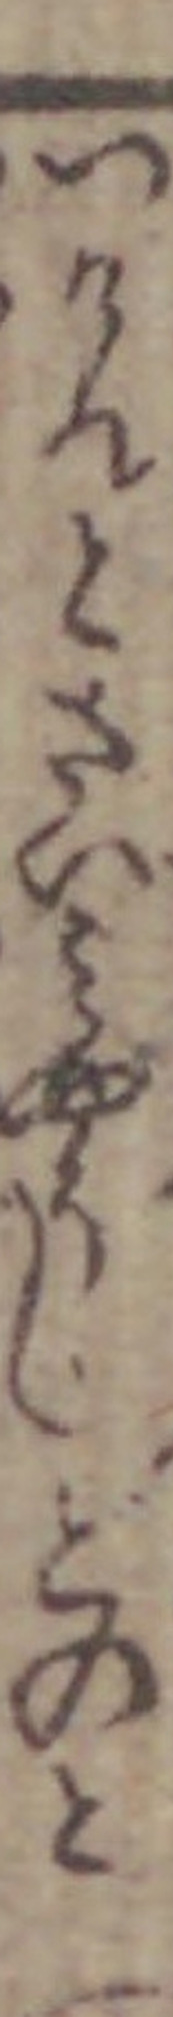つけんとさいみやうしどのと
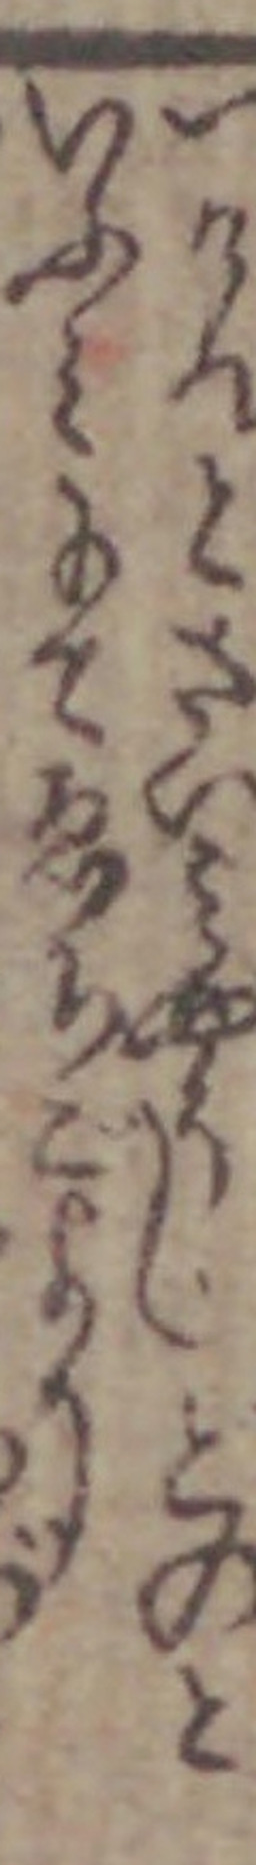いふみにてゑちごより
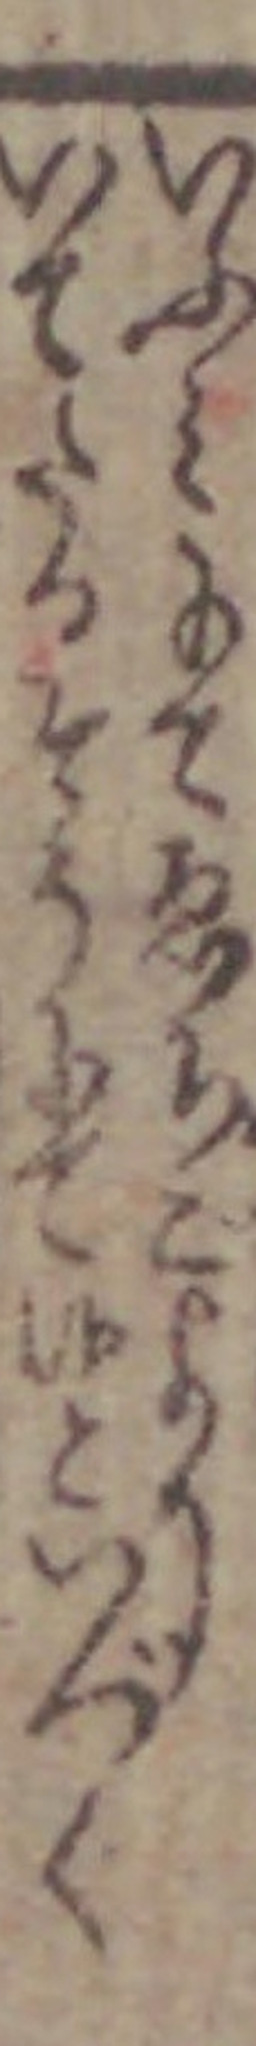いてたるそうにて候といづく
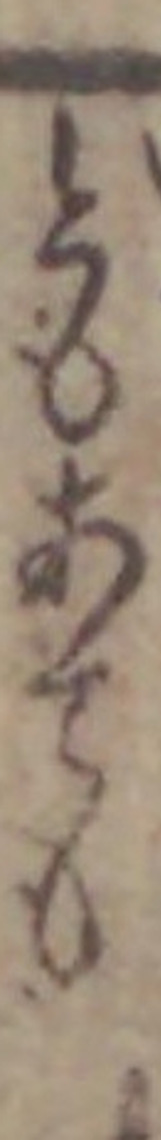ともあても
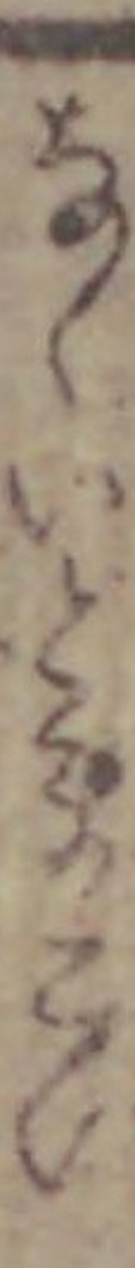なくいとまこい
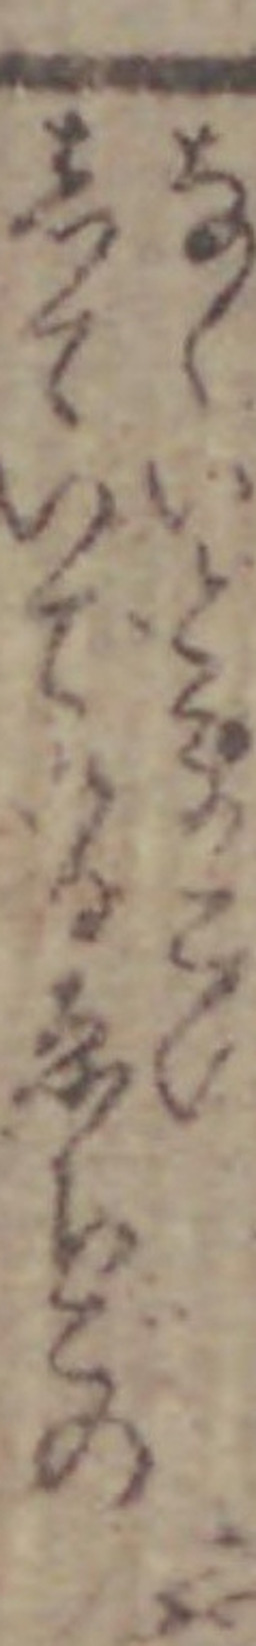していてけるゑちごの
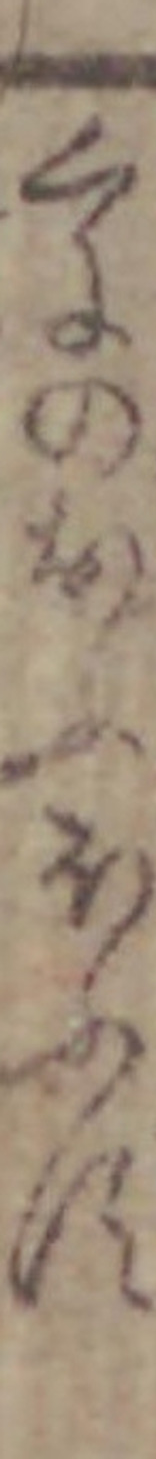くにのおふぼふず
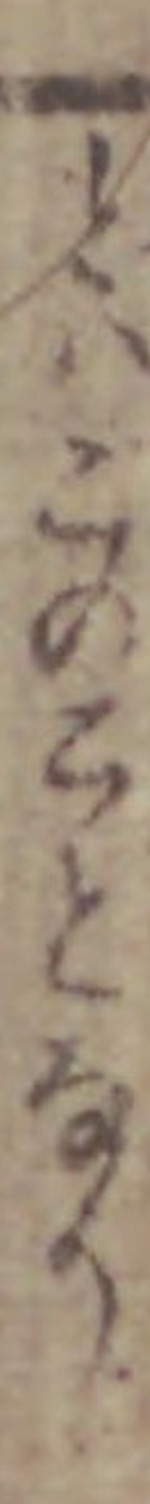とはこのことなり
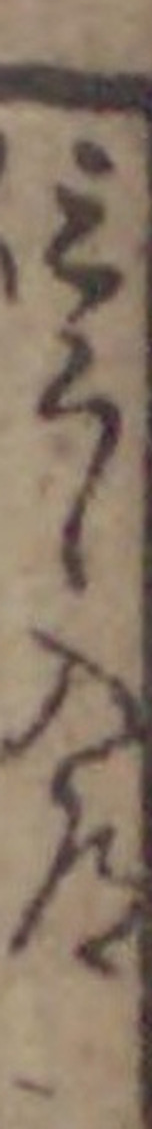みこし入道
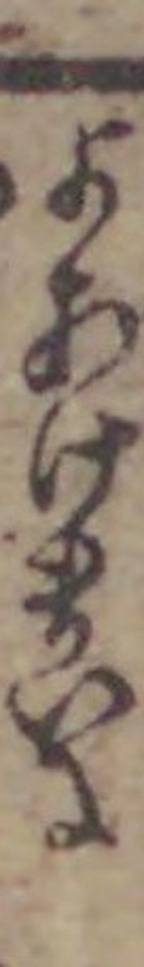よあけまいに
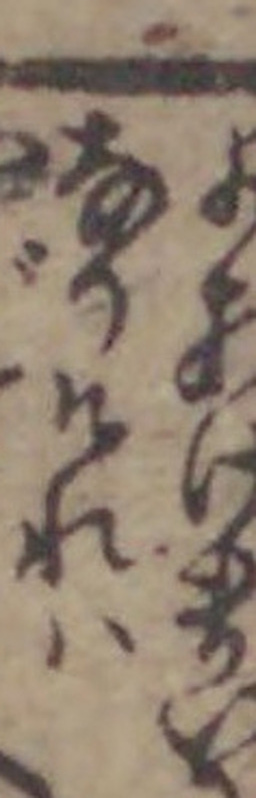なりけれは
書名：化物鼻がひしげ 2巻
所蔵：国立国会図書館 National Diet Library, JAPAN
